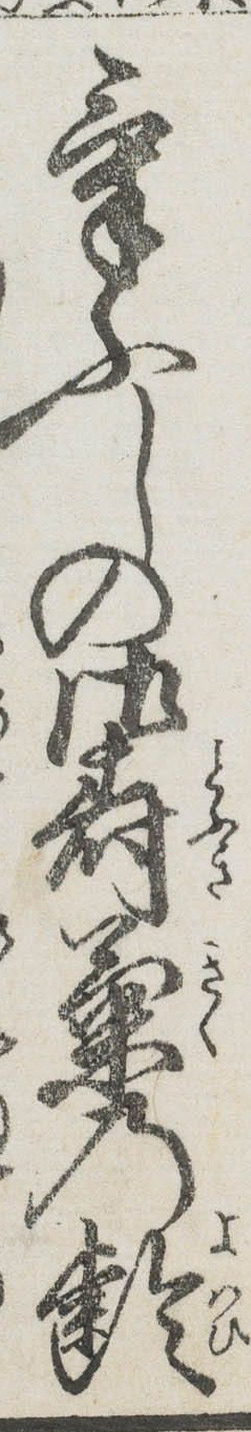気ふしの御寿菊の齢
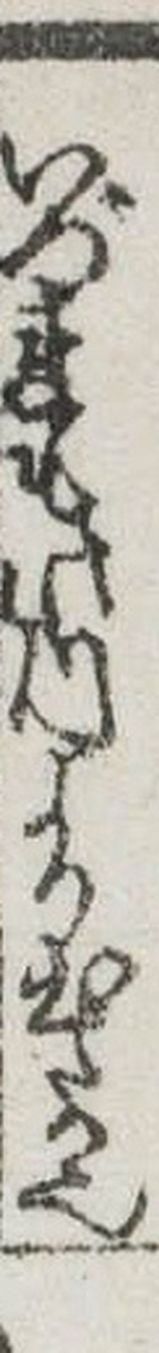いづれも此門より出たる也
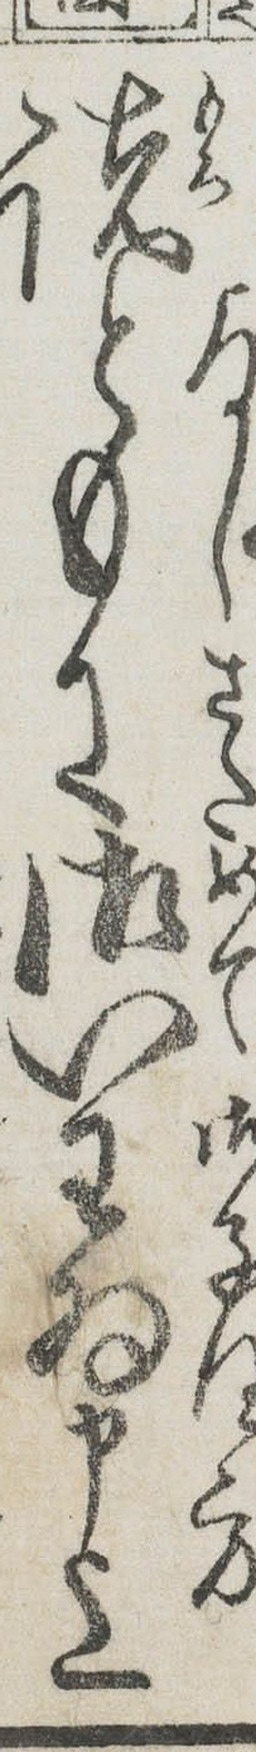諸とも御いわゐ申上
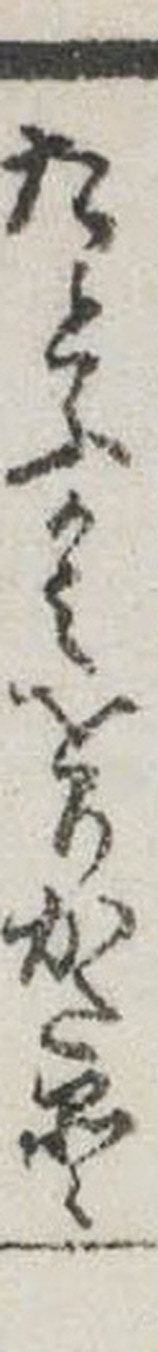たとふかみをりかた品々
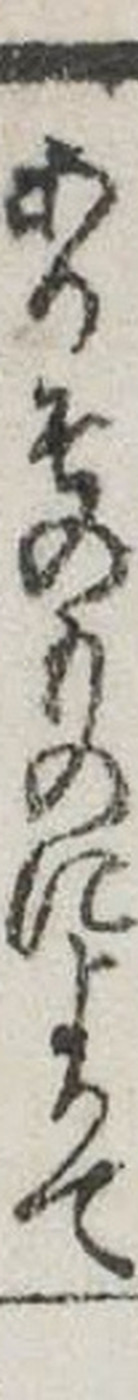ありそのものによつて
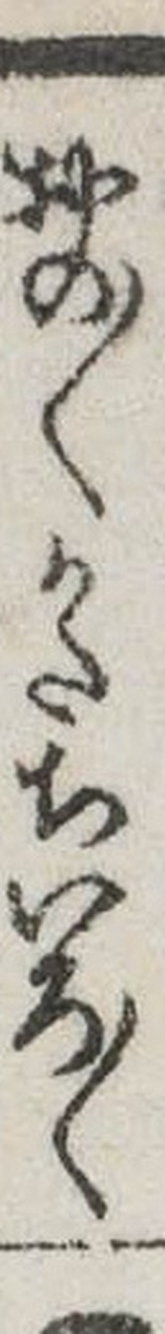おの〳〵かたちいろ〳〵
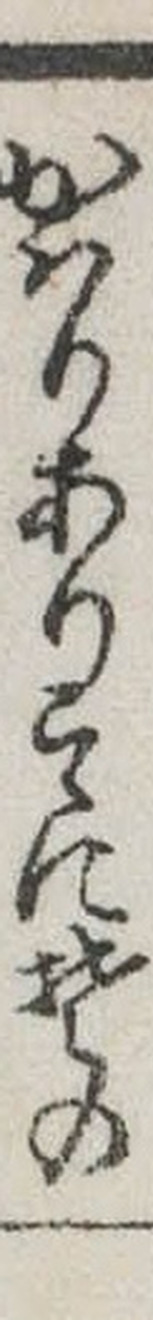かはりありこゝにその
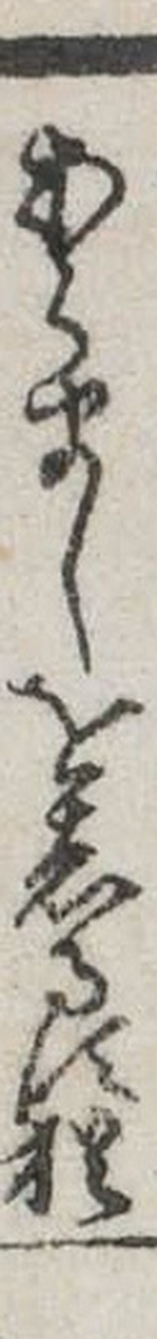あらましをしるす猶
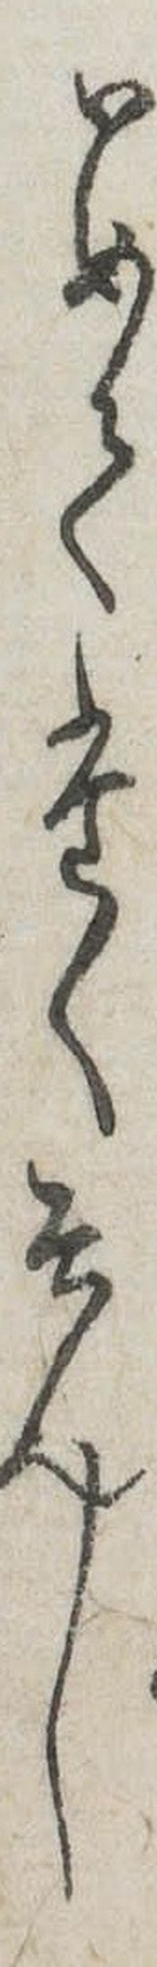御めてたくそんし
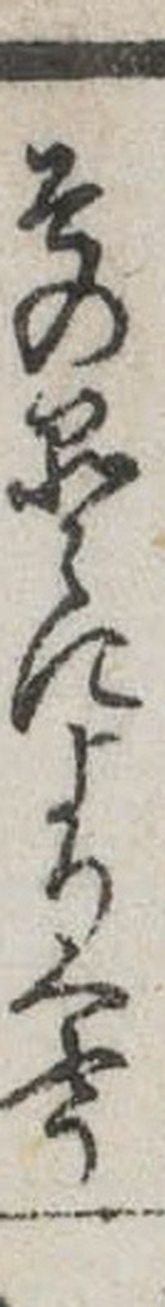その品々によりくふう
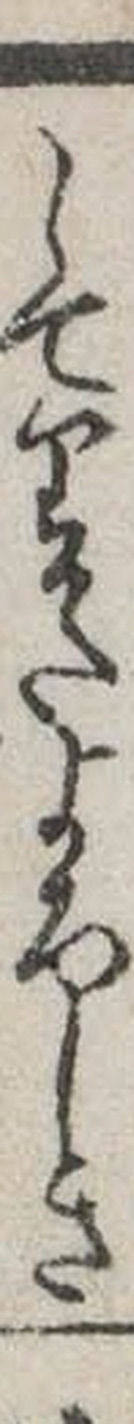してわかたよろしき
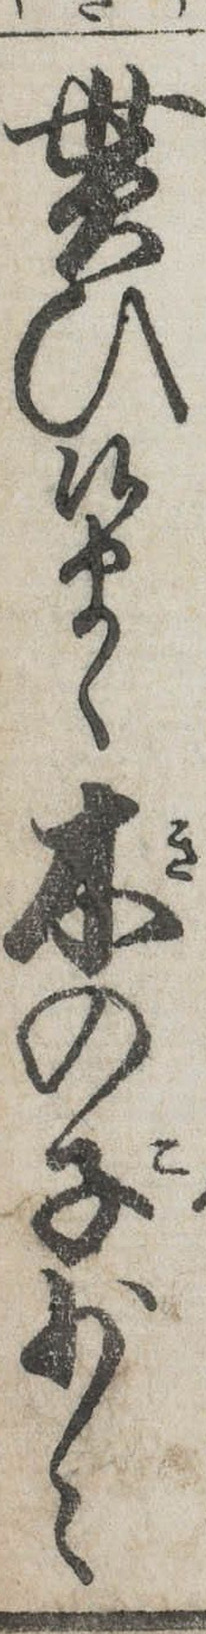貰ひ候まゝ木の子少々
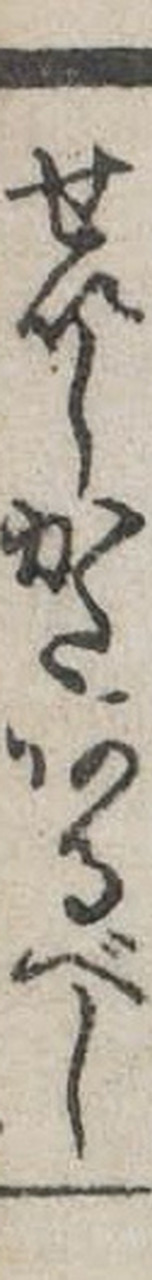せいしかたあるべし

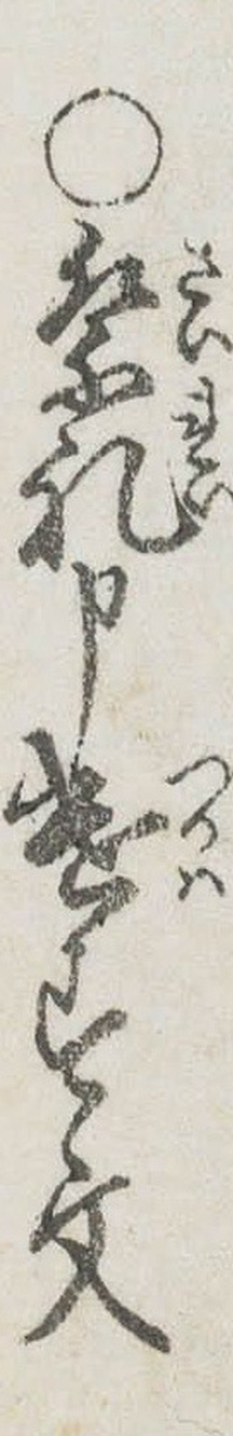○祭礼申遣す文
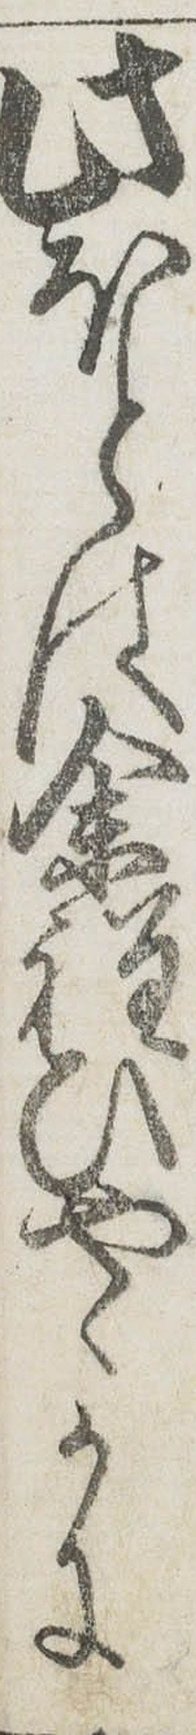此ほとは余程ひやゝかに
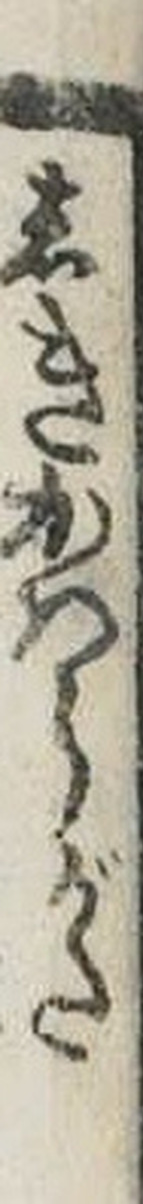しきかはらがた
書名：頭書萬用婦人手紙之文言
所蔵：東京学芸大学教育コンテンツアーカイブ
